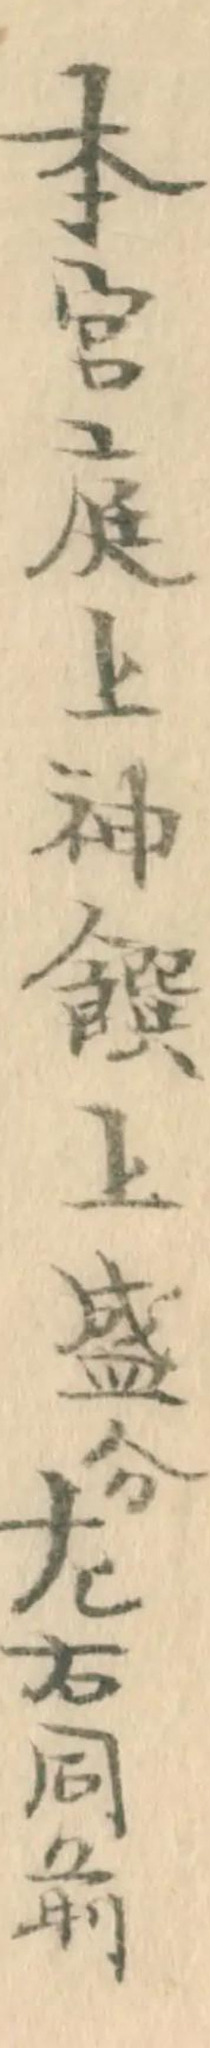本宮庭上神饌上盛分左右同前
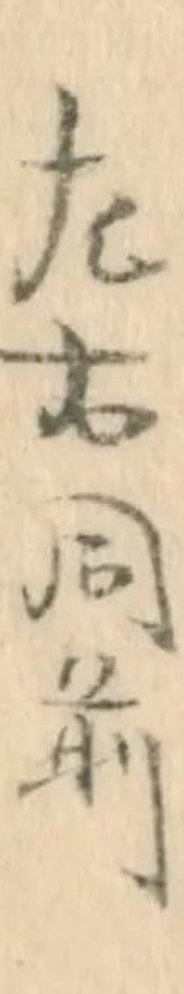左右同前
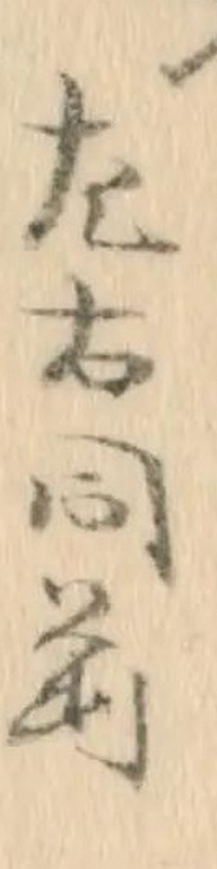左右同前
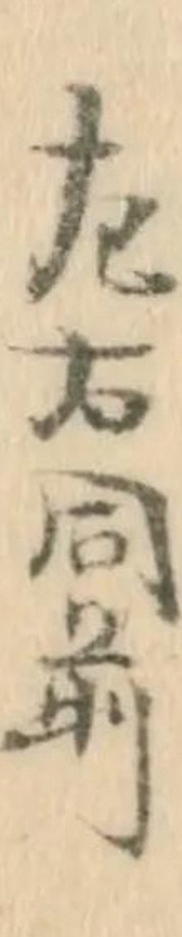左右同前

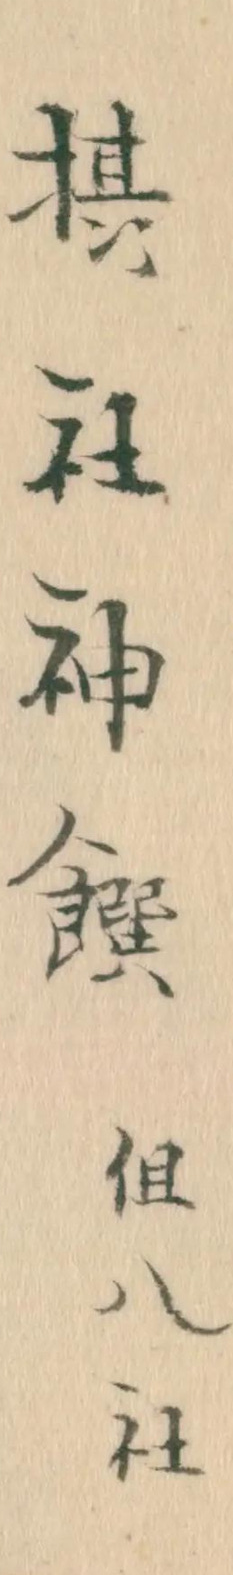摂社神饌但八社
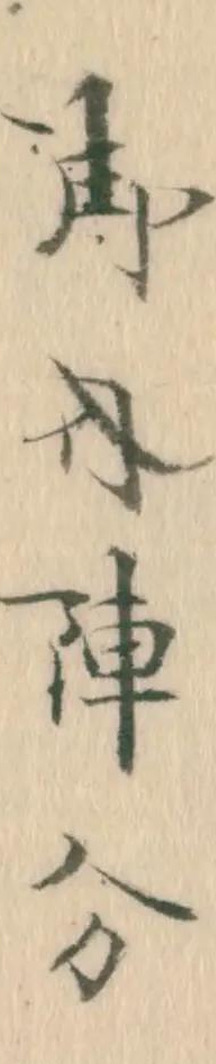御内陣分
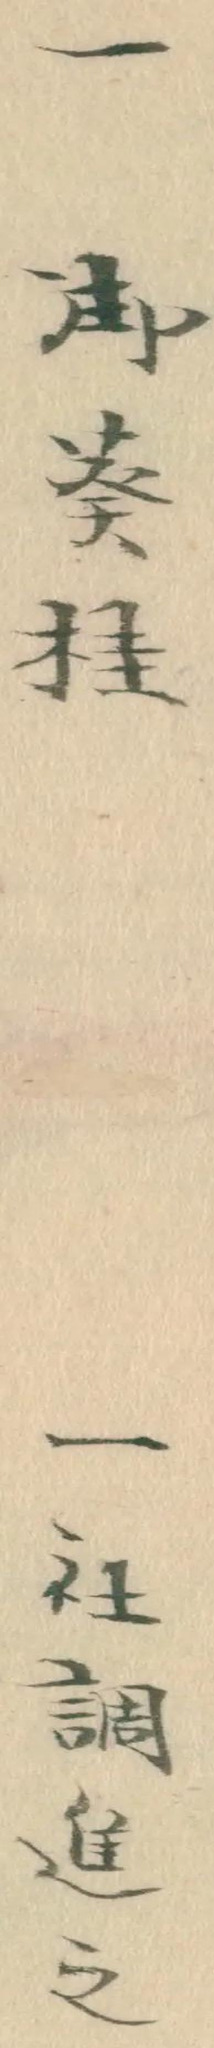一御葵柱一社調進之
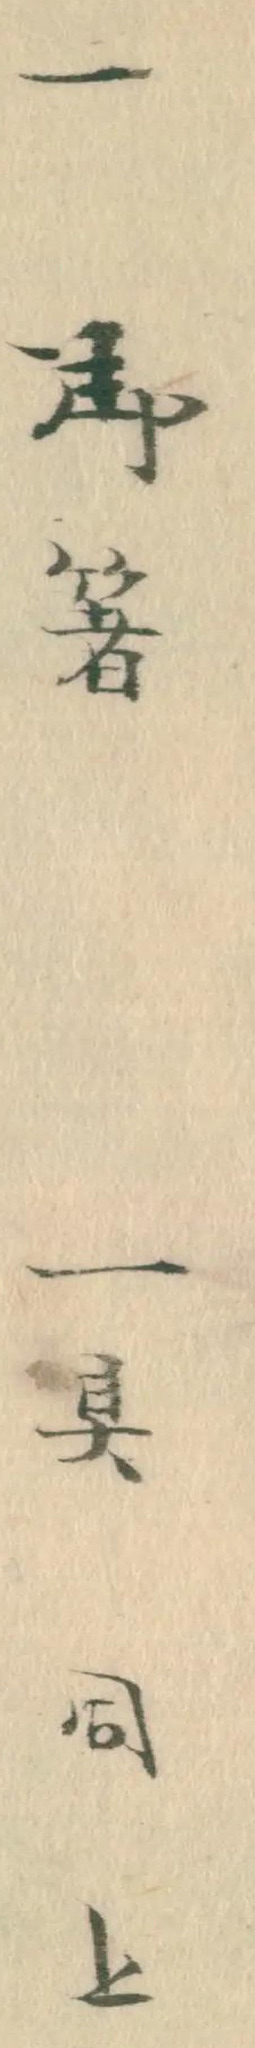一御箸一具同上
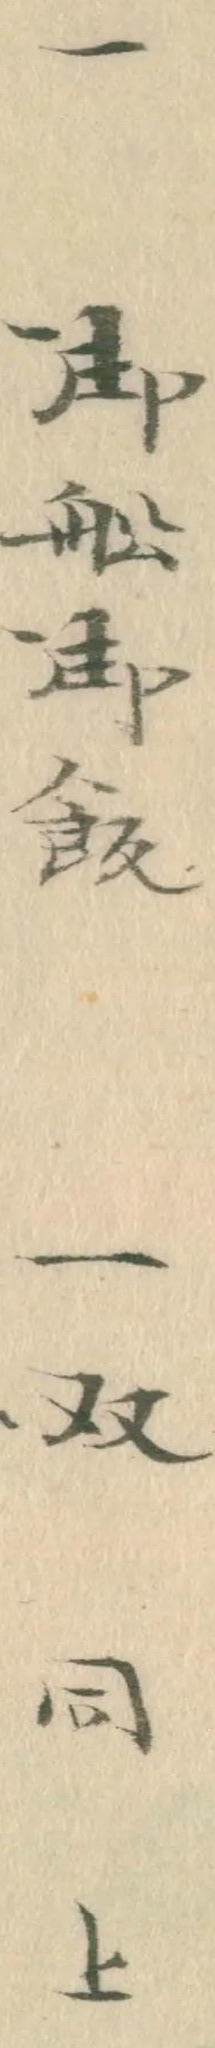一御船御飯一双同上
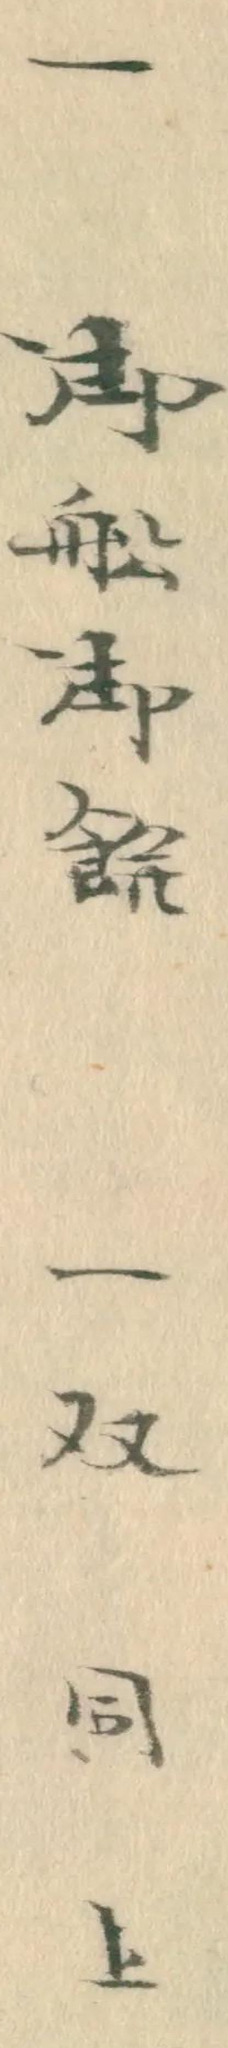一御船御餅一双同上
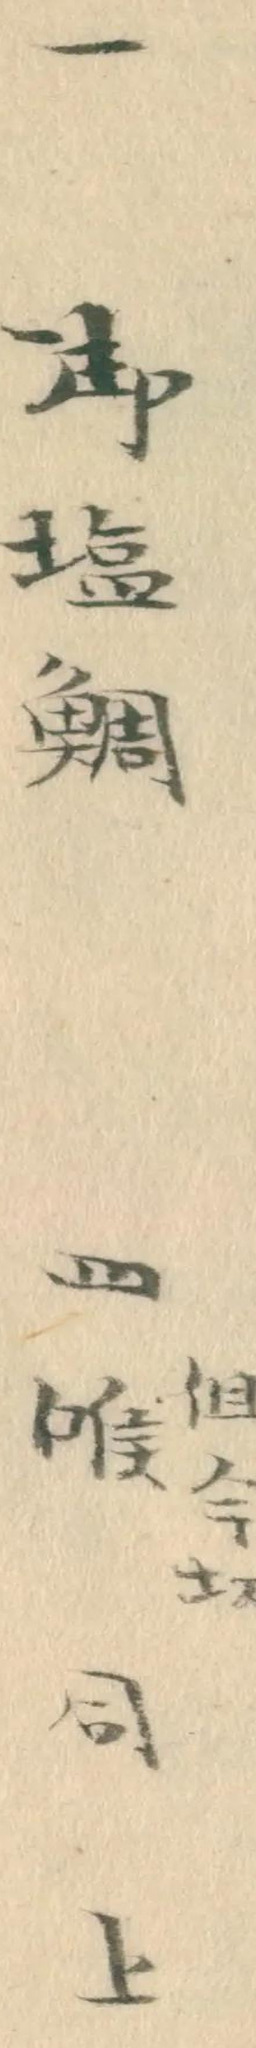一御塩鯛四喉同上

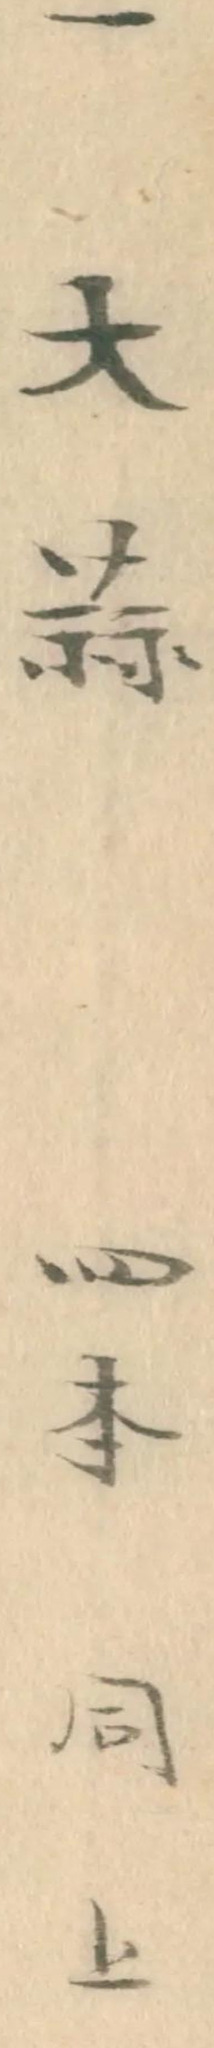一大蒜四本同上
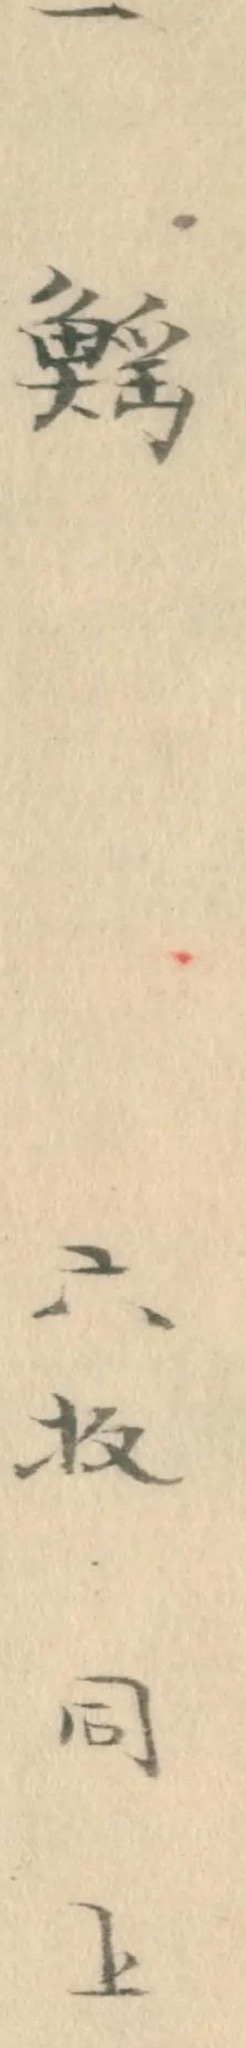一鰩六枚同上
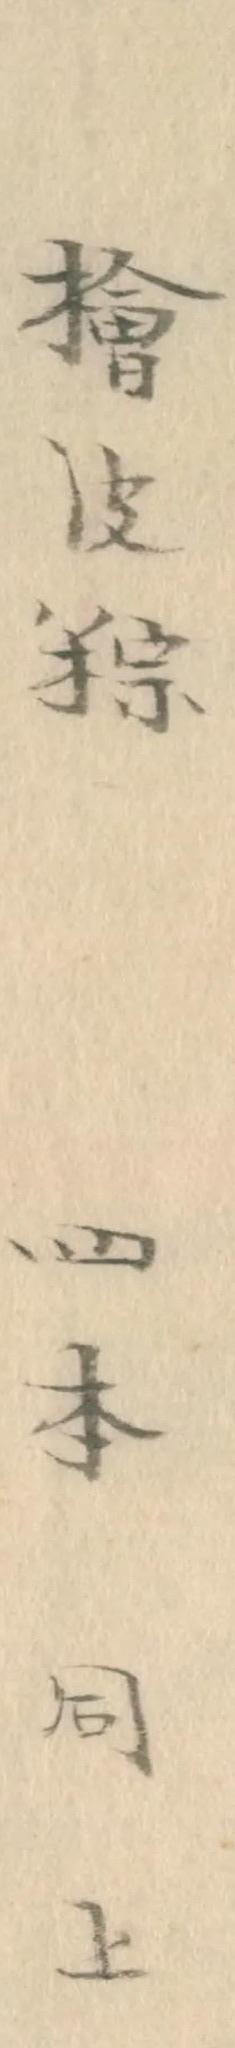一檜皮粽四本同上
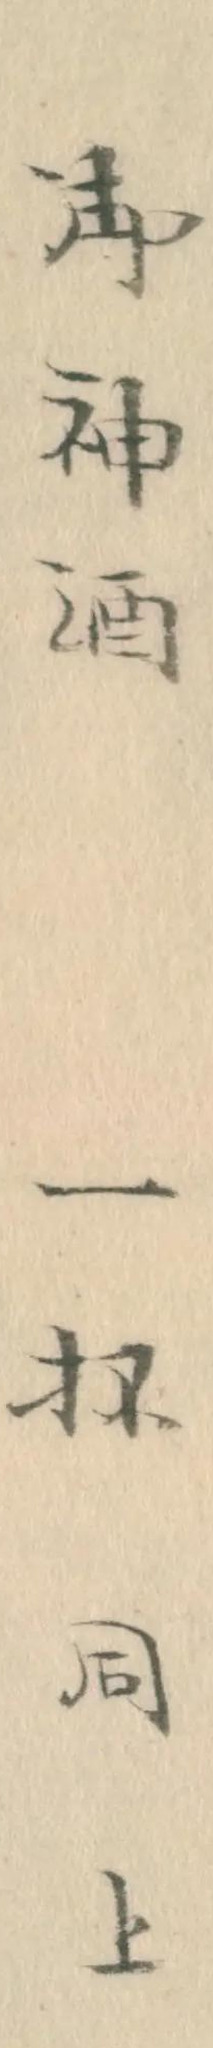一御神酒一抔同上
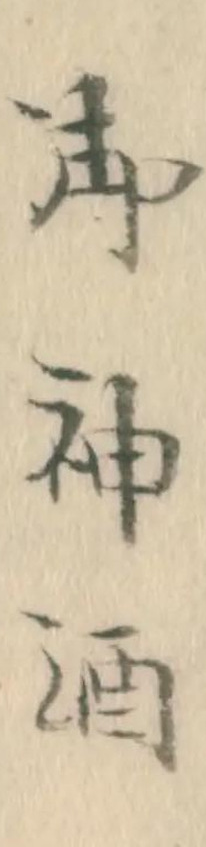御神酒
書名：葵御祭供進之神饌諸品色目書
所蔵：国立国会図書館 National Diet Library, JAPAN
